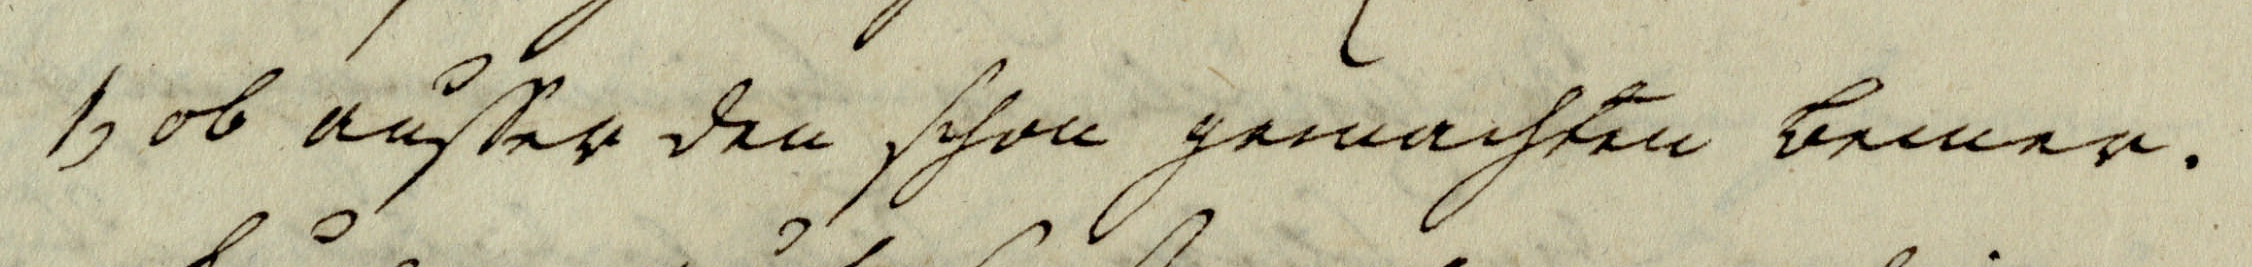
1, ob ausser den schon gemachten Bemer¬
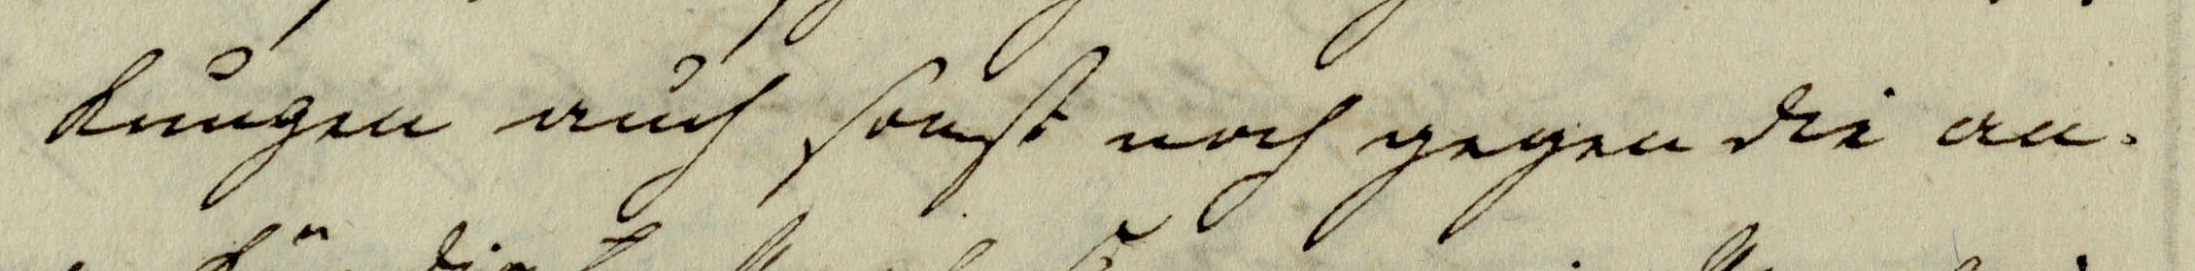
kungen auch sonst noch gegen die an¬
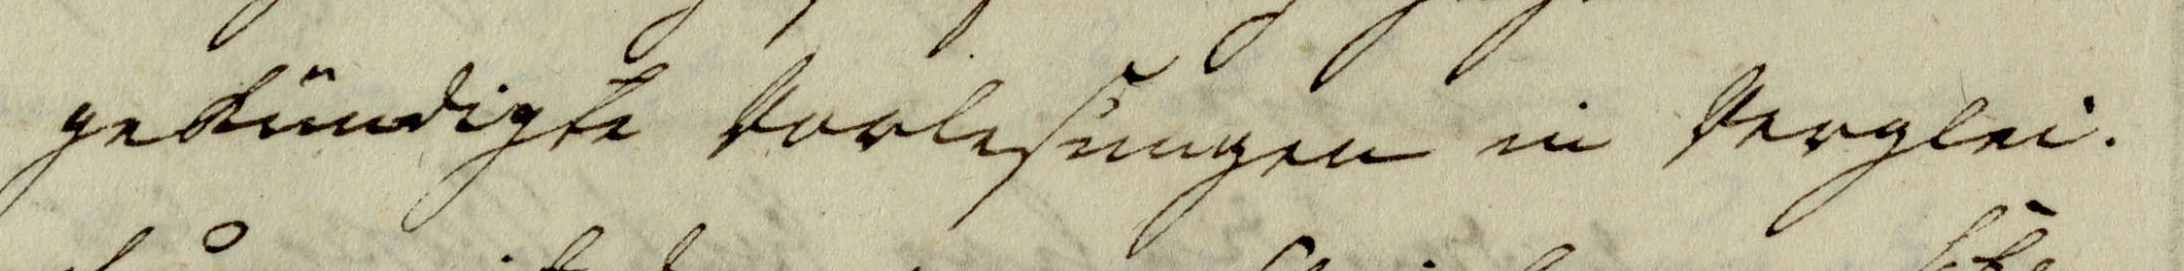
gekündigte Vorlesungen in Verglei¬
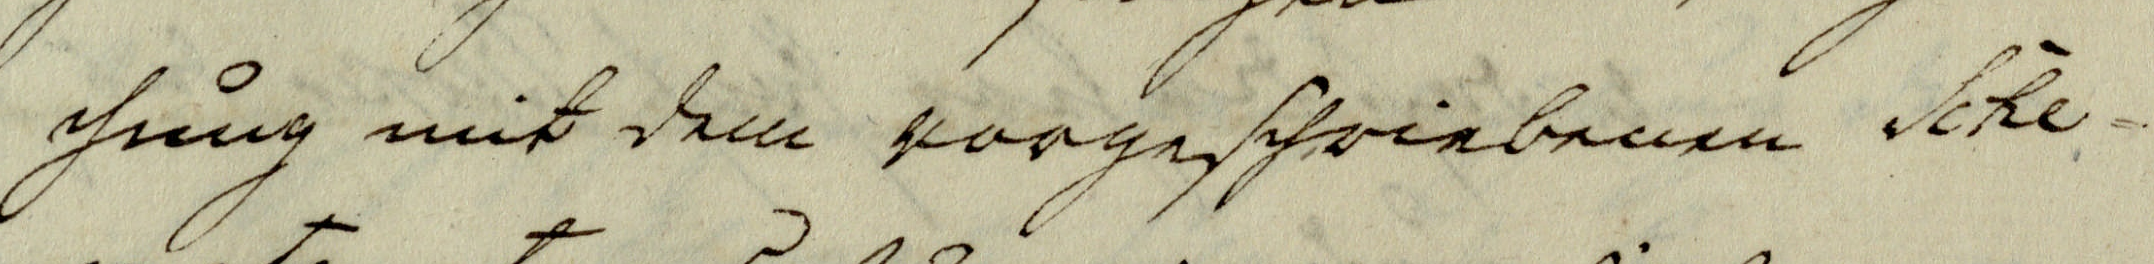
chung mit dem vorgeschriebenen Sche¬
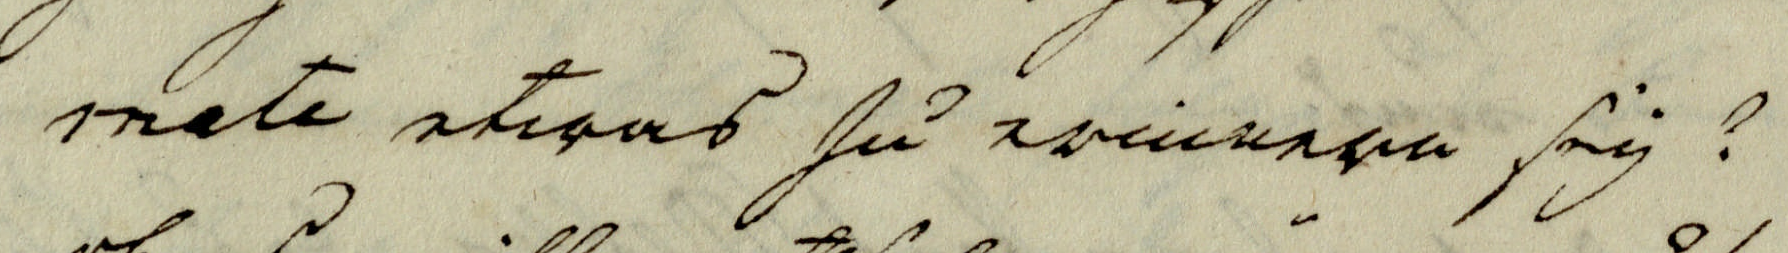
mate etwas zu erinnern seÿ?
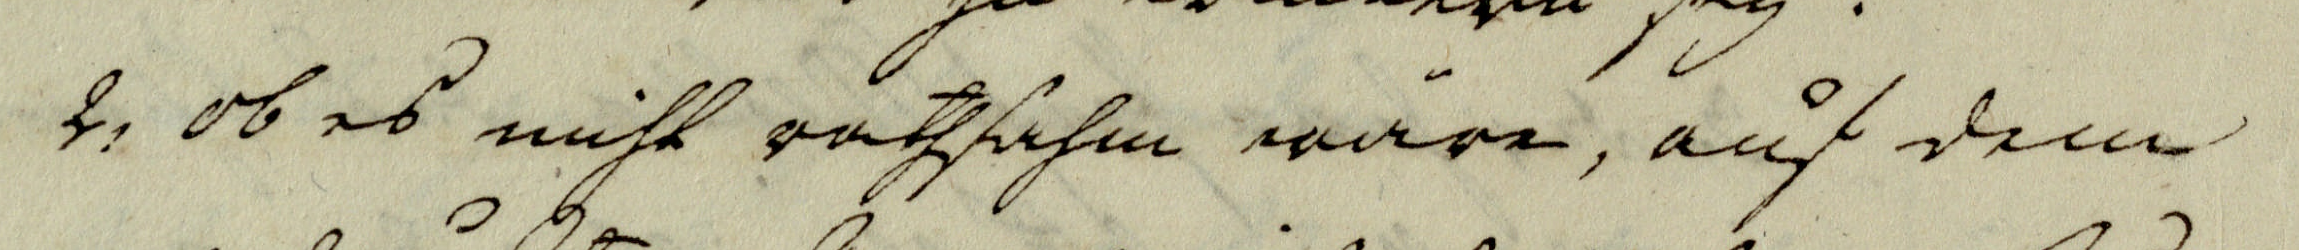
2, ob es nicht rathsahm wäre, auf dem
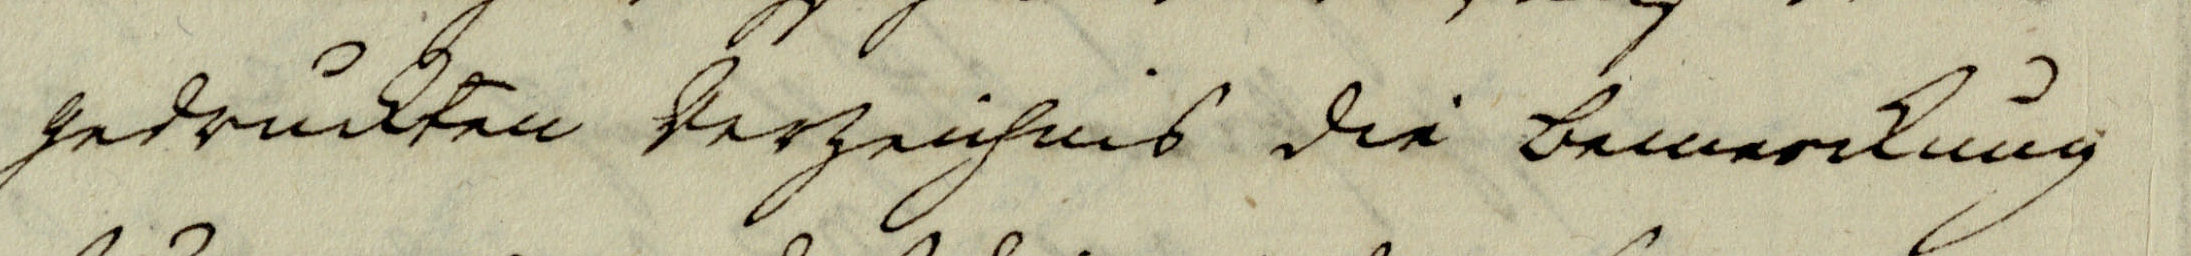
gedruckten Verzeichnis die Bemerckung
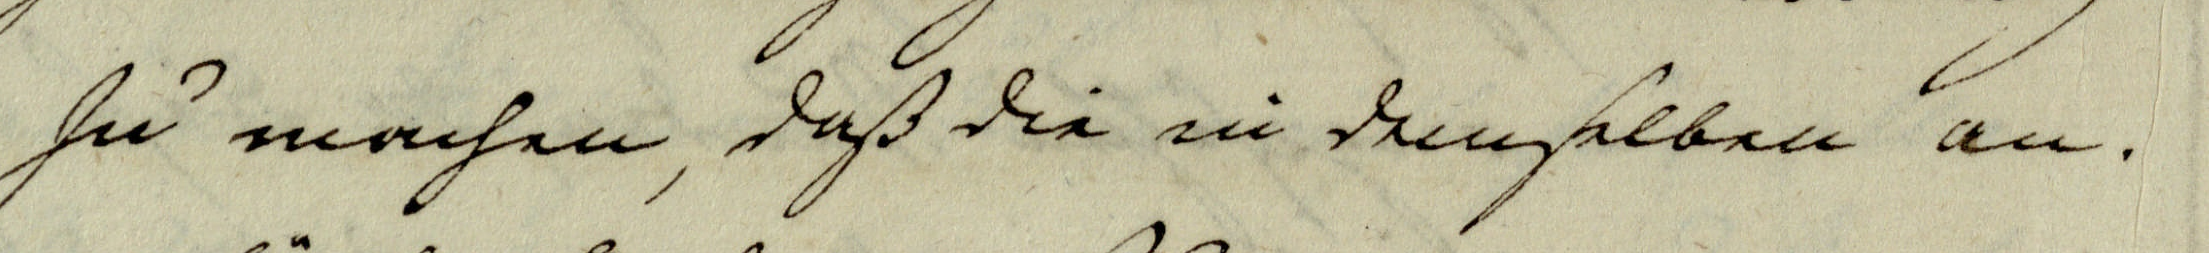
zu machen, daß die in demselben an¬
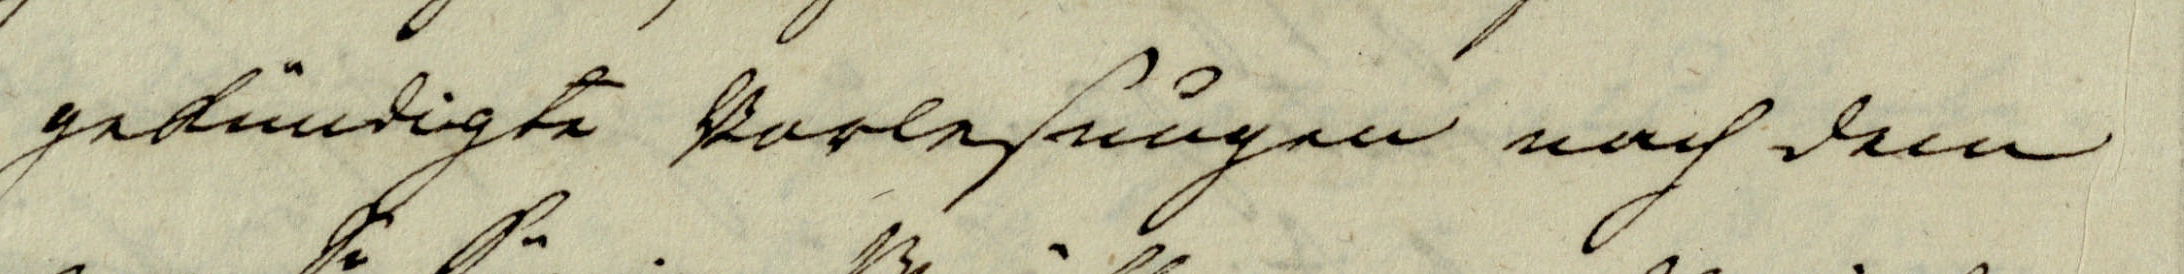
gekündigte Vorlesungen nach dem
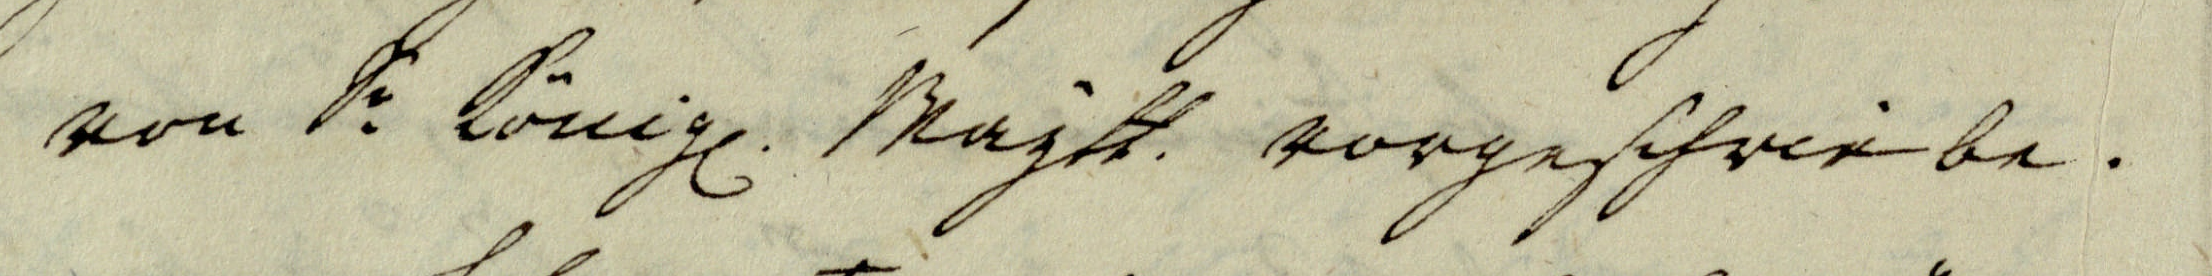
von Sr. Königl. Maÿtt. vorgeschriebe¬
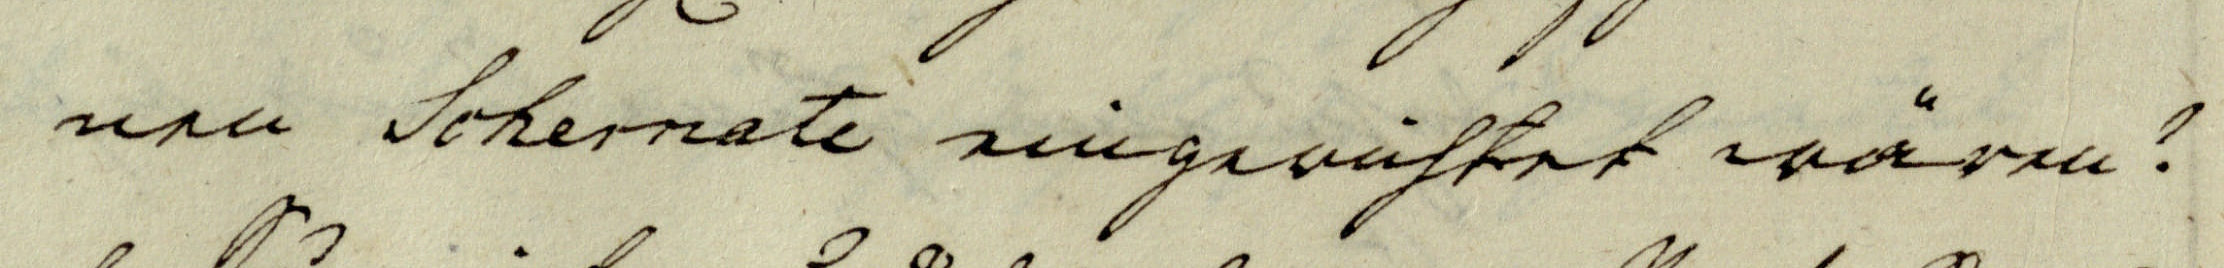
nen Schemate eingerichtet wären?
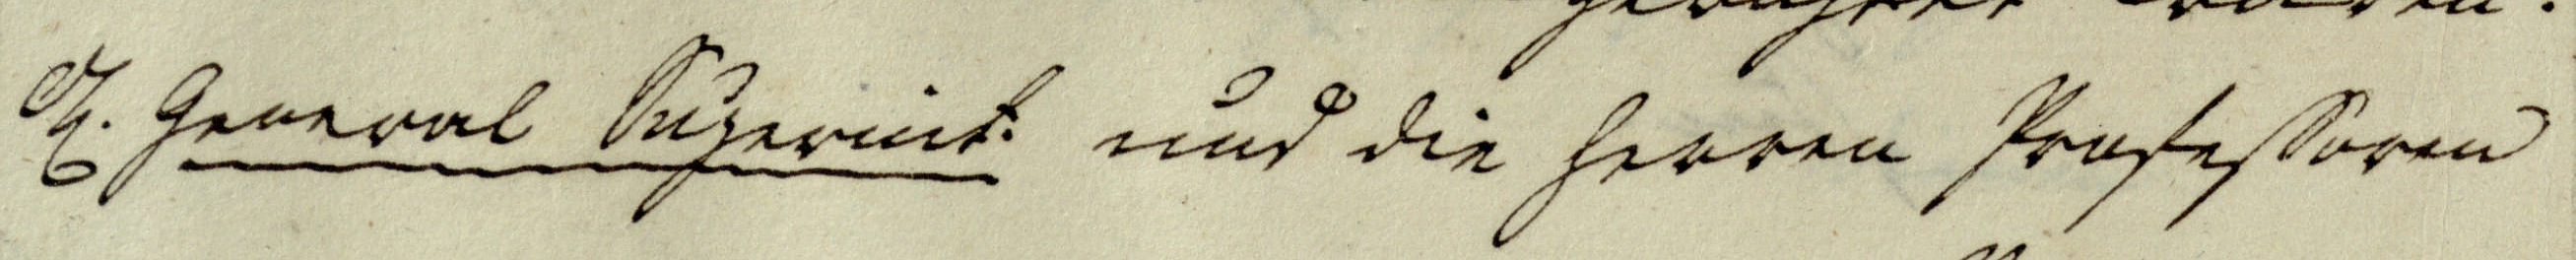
dh. General Superint. und die Herren Professoren
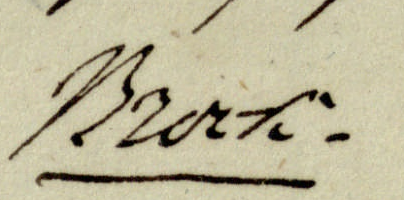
Brock¬
